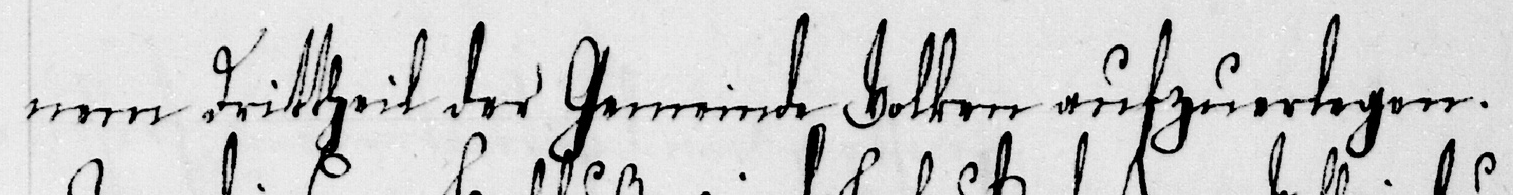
nem Drittheil der Gemeinde Volken aufzuerlegen.
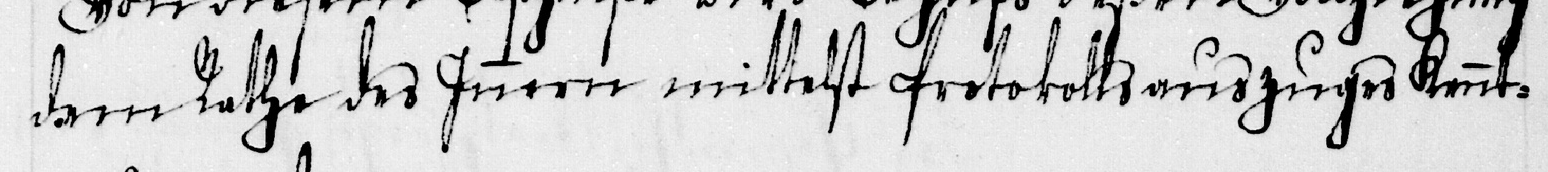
dem Rathe des Innern mittelst Protokollsauszuges Kennt¬
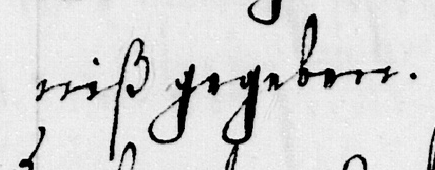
niß gegeben.
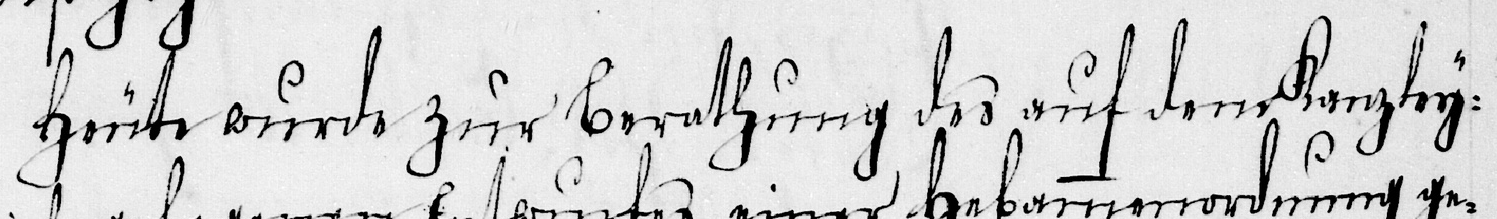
Heute wurde zur Berathung des auf dem Kanzley¬
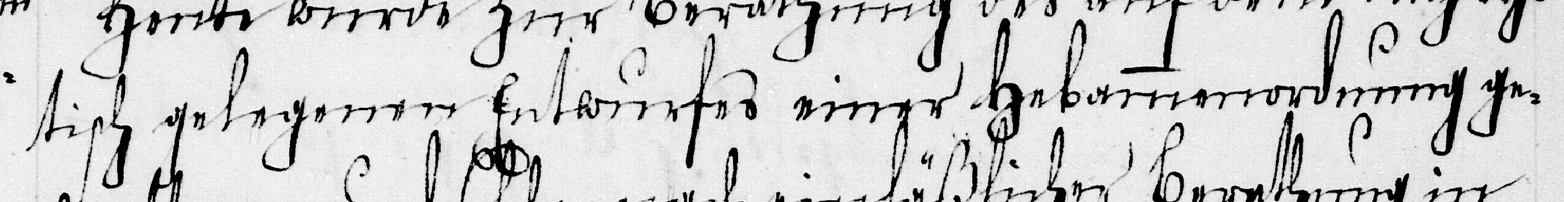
tisch gelegenen Entwurfes einer Hebammenordnung ge¬
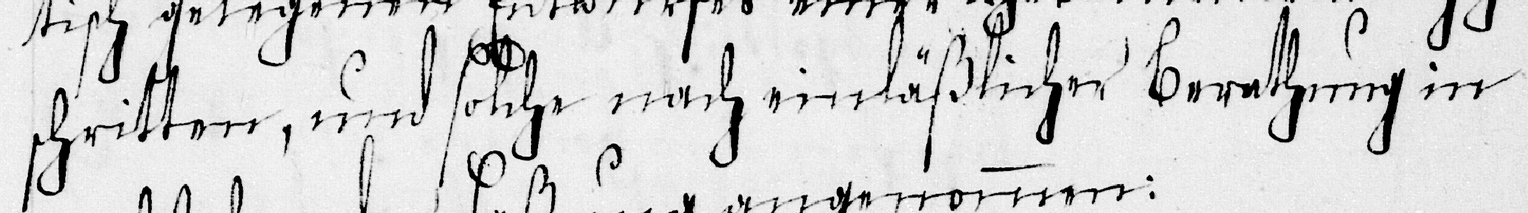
schritten, und solche nach einläßlicher Berathung in
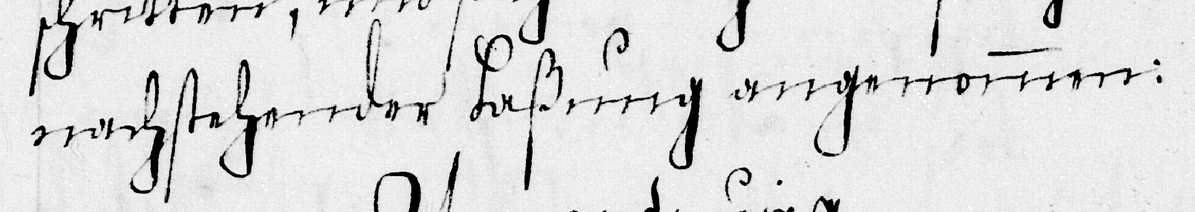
nachstehender Faßung angenommen:
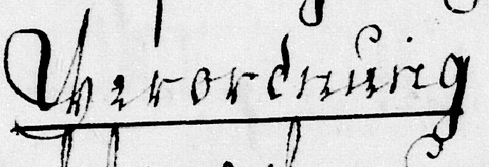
Verordnung
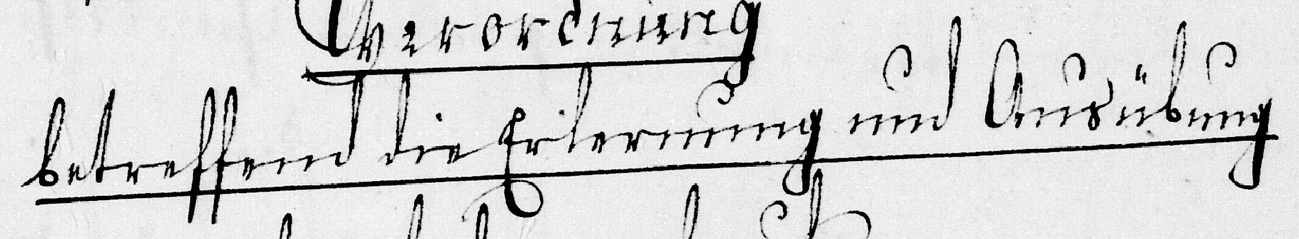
betreffend Erlernung und Ausübung
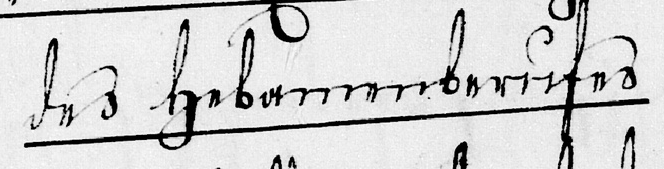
des Hebammenberufes
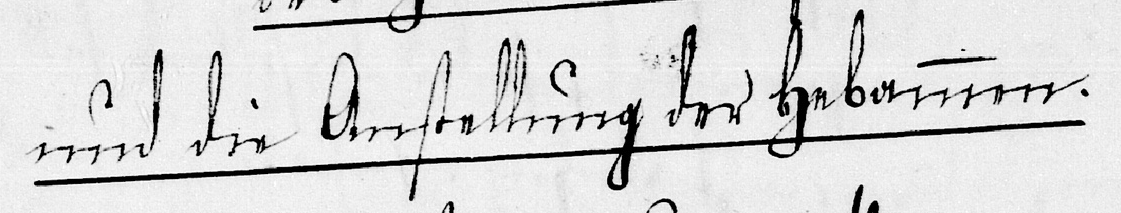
und die Anstellung der Hebammen.
